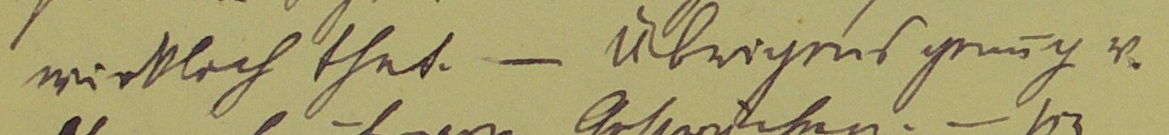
wirklich that. - Übrigens genug v.
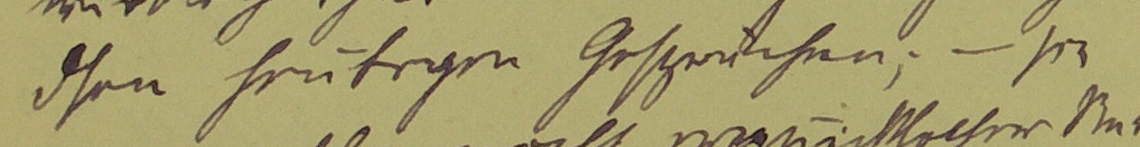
dsen heutigen Gesprächen. - sie
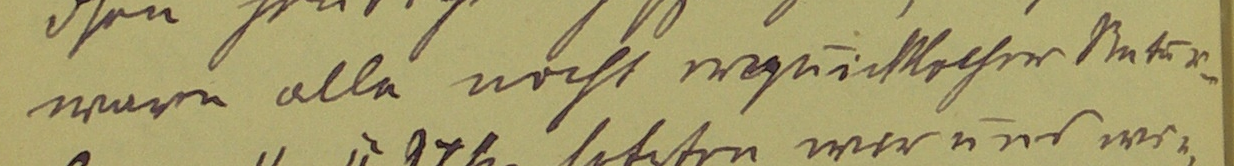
waren alle nicht erquicklicher Natur. -
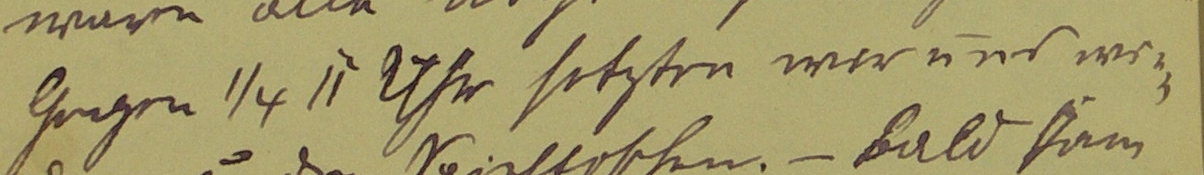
Gegen ¼ 11 Uhr setzten wir uns wie¬
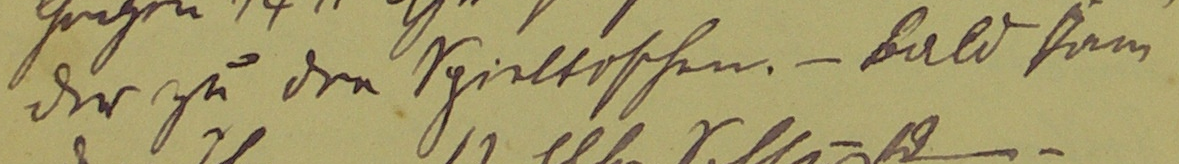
der zu den Spieltischen. - Bald kam
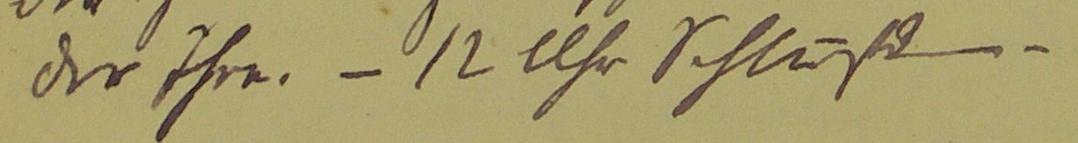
der Thee. - 12 Uhr Schluß.-
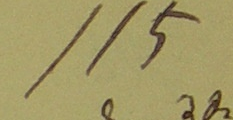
115
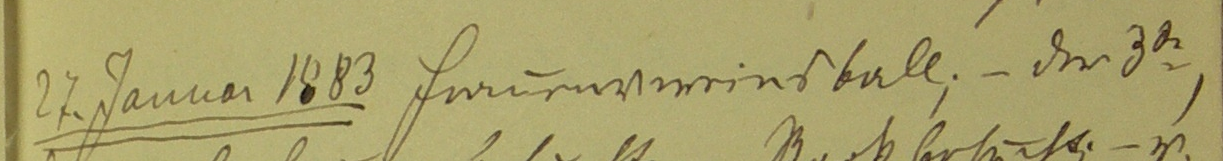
27. Januar 1883 Frauenvereinsball;- der 3-te
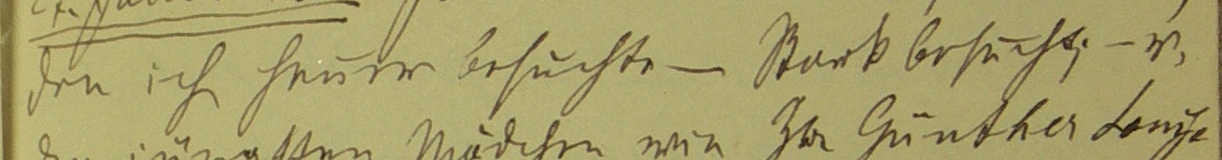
den ich heuer besuchte. - Stark besucht: -v.
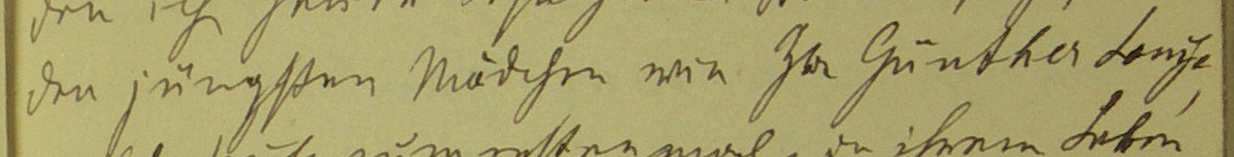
den jüngsten Mädchen wie Frl. Günther Lange,
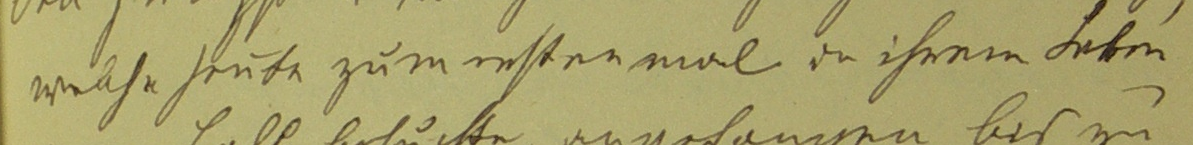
welche heute zum erstenmal in ihrem Leben
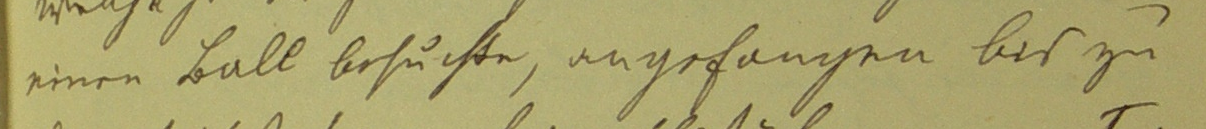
einen Ball besuchte, angefangen bis zu
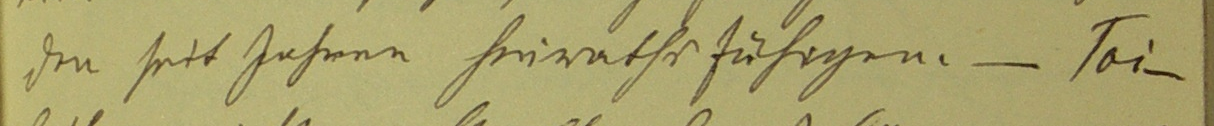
den seit Jahren Heiratsfähigen. - Toi
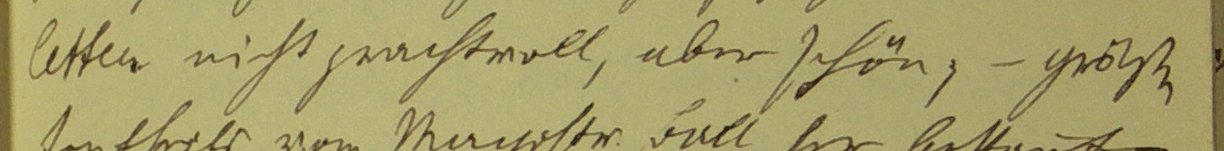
letten nicht prachtvoll ,aber schön, - größ¬
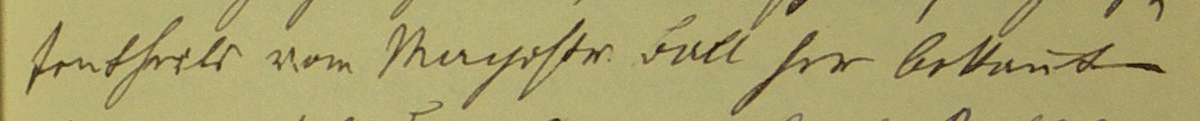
tentheils vom Magister Ball her bekannt.
